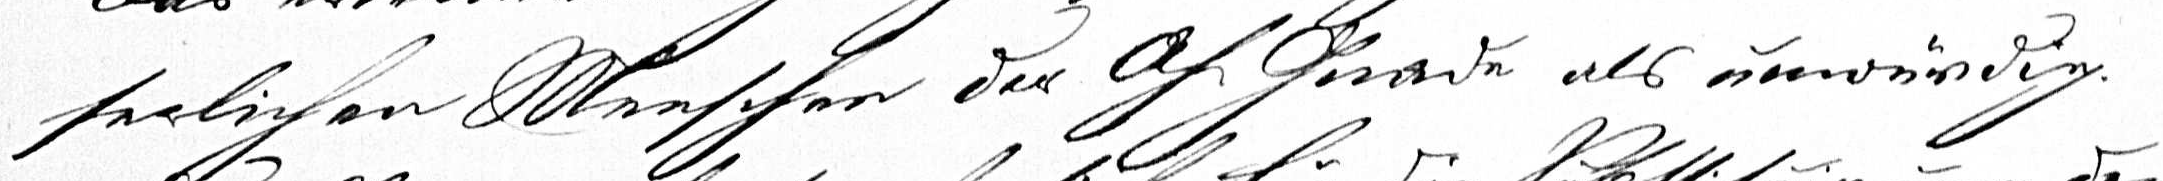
serlichen Menschen der Ah. Gnade als unwürdig.
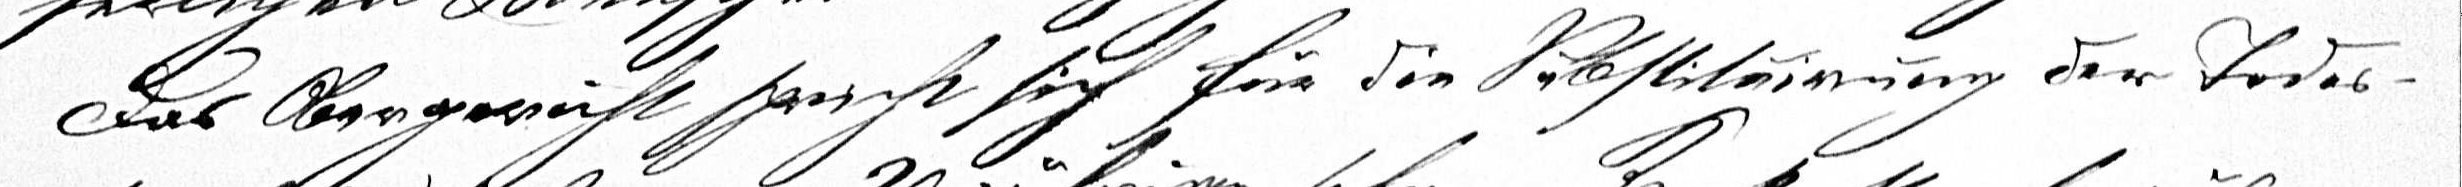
Das Obergericht spricht sich für die Substituirung der Todes¬
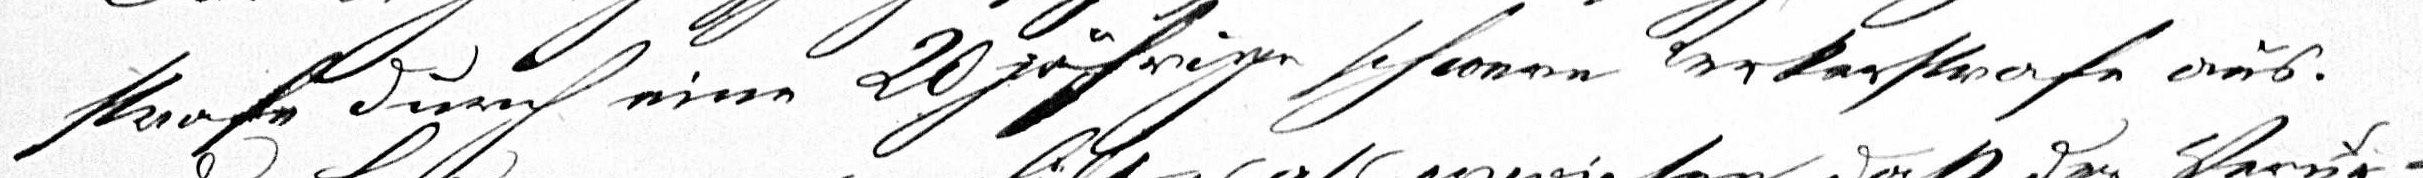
strafe durch eine 20 jährige schwere Kerkerstrafe aus.
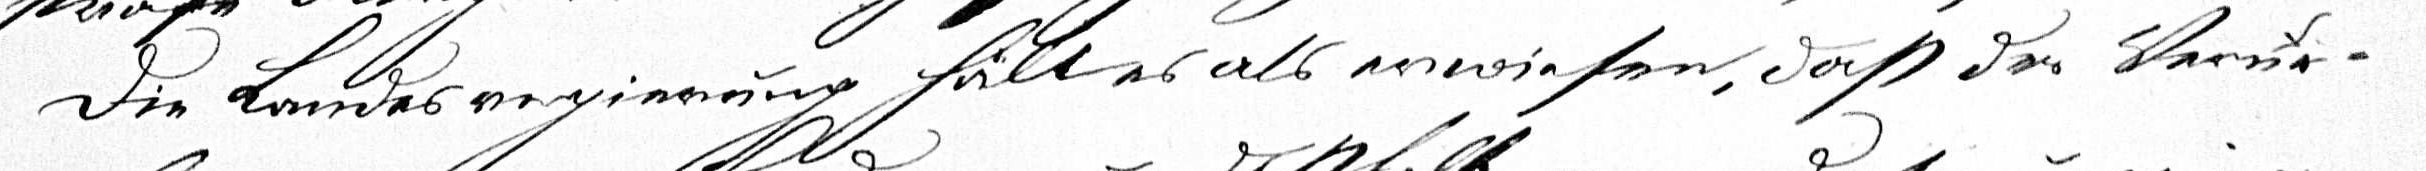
Die Landesregierung hält es als erwiesen, daß der Verur¬
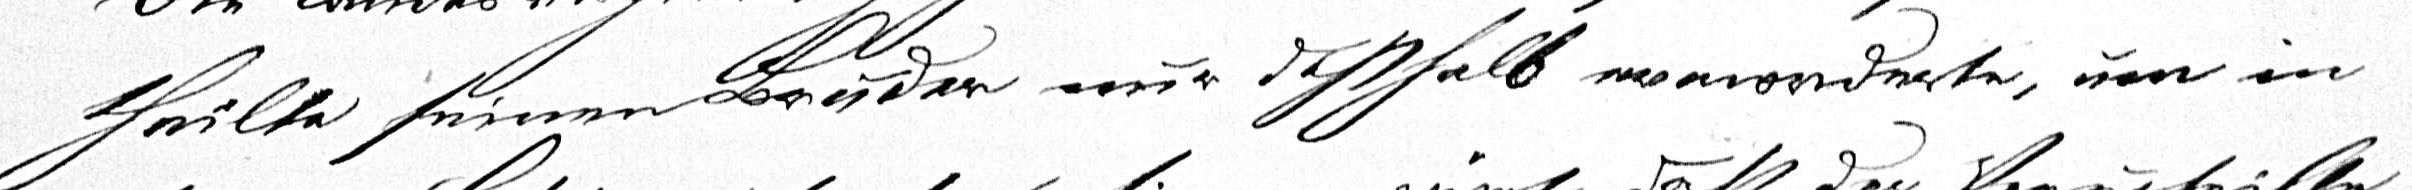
theilte seinen Bruder nur desßhalb xxderte, um in
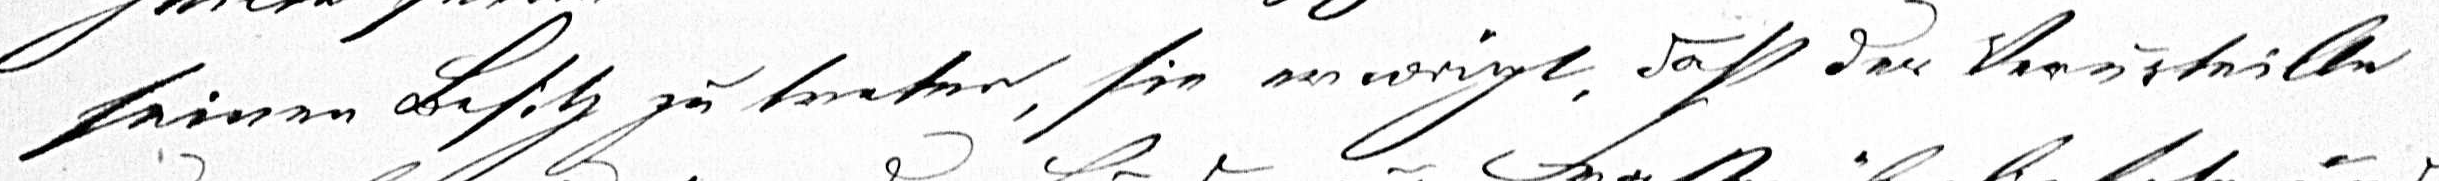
seinen Besitz zu treten, sie erwägt, daß der Verurteilte
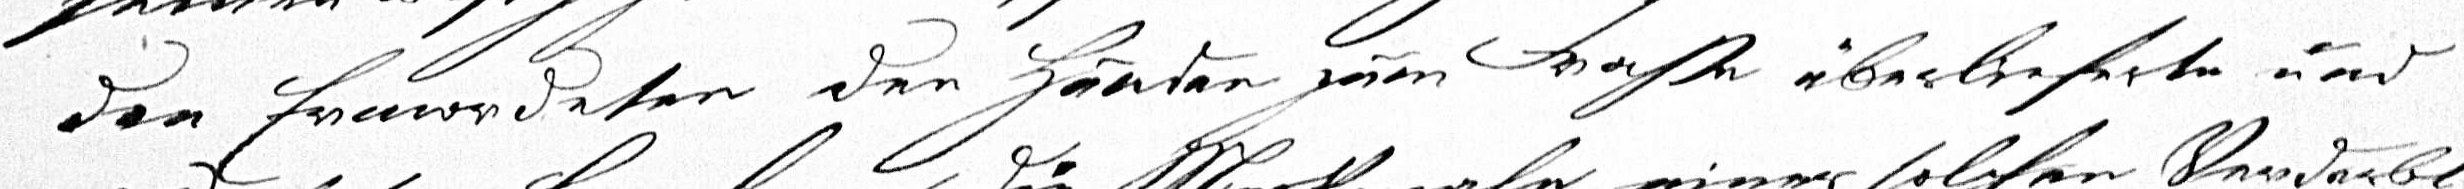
den Ermordeten den Händen zum Fraße überlieferte und
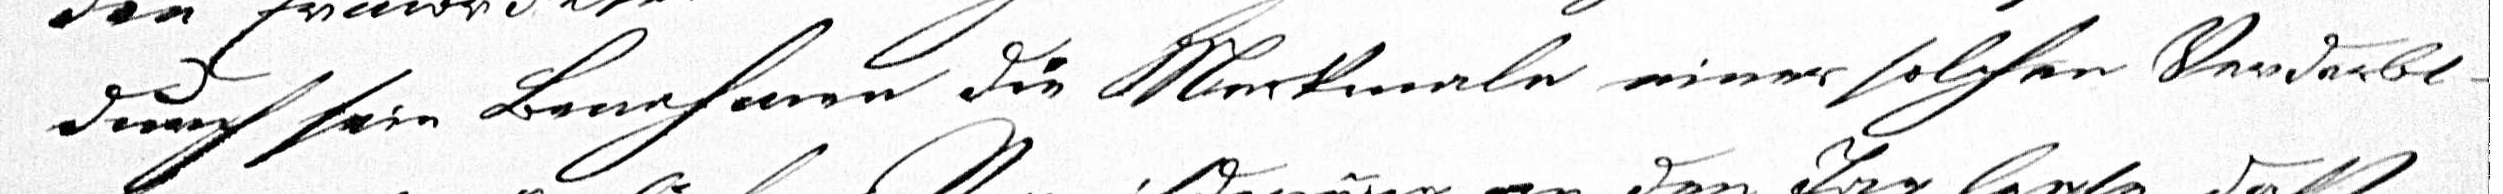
durch sein Benehmen die Merkmale einer solchen Verderbt¬
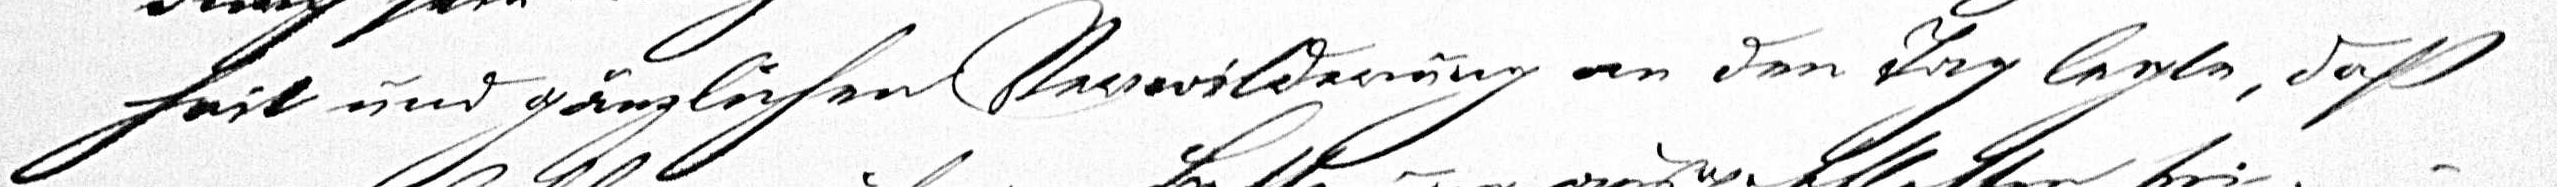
heit und gänzlichen Verwilderung an den Tag legte, daß
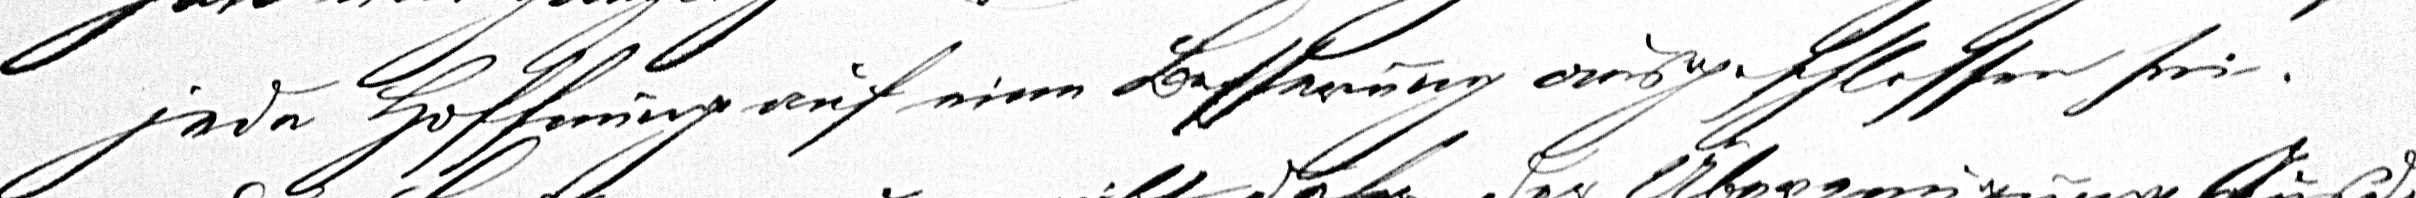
jede Hoffnung auf eine Besserung ausgeschlossen sei.
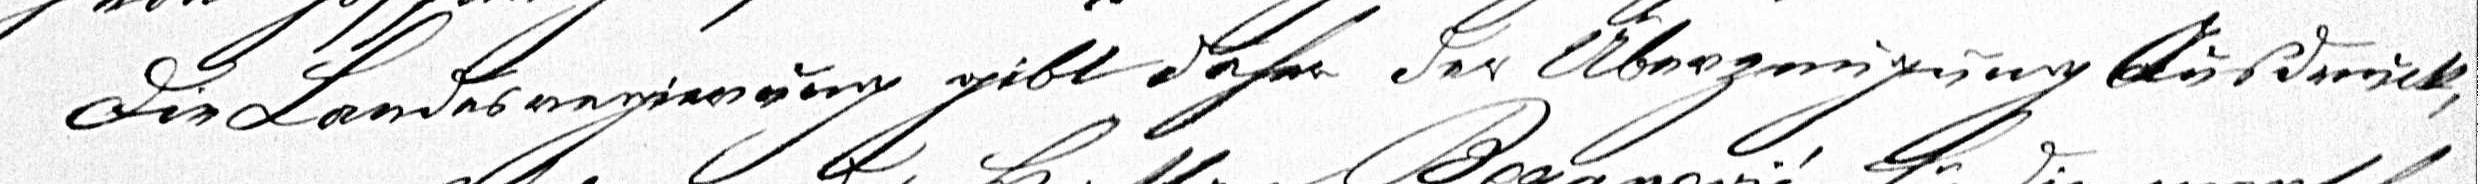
Die Landesregierung gibt daher der Überzeugung Ausdruck,
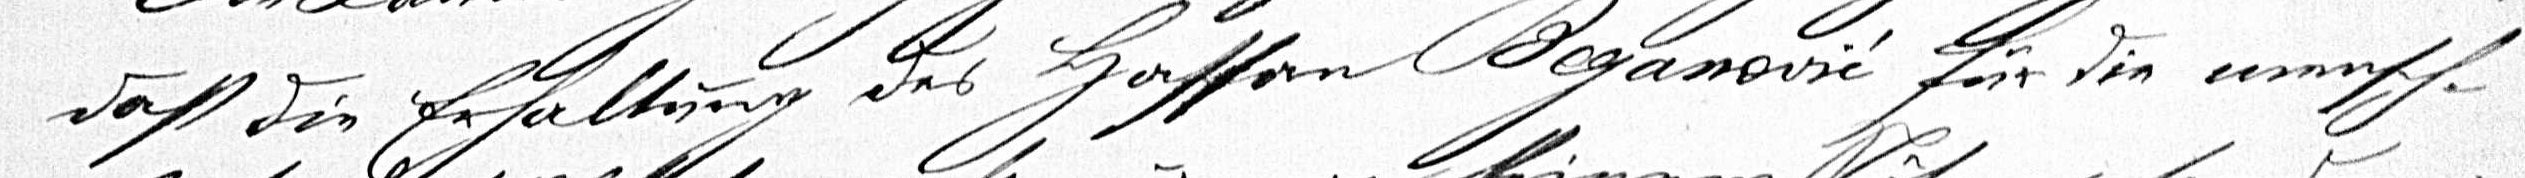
daß die Erhaltung des Hassan Beganović für die mensch¬
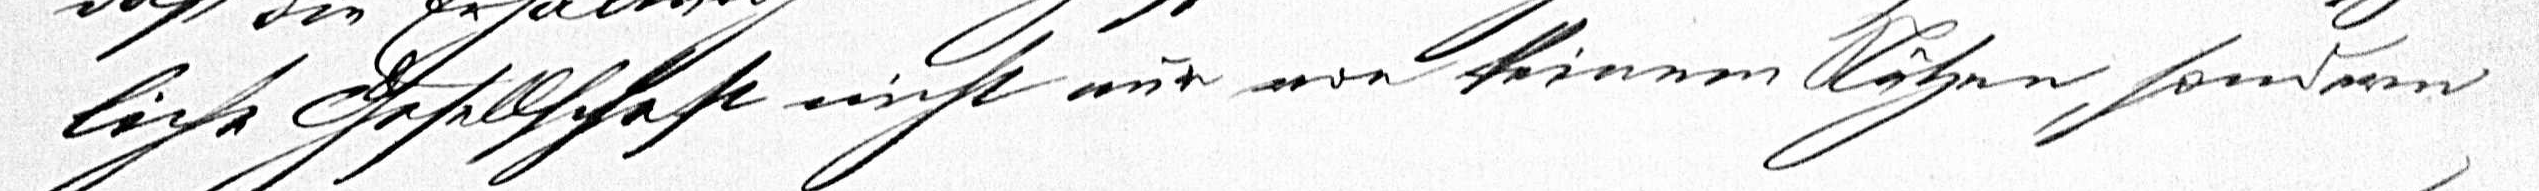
liche Gesellschaft nicht nur von keinem Nützen, sondern
